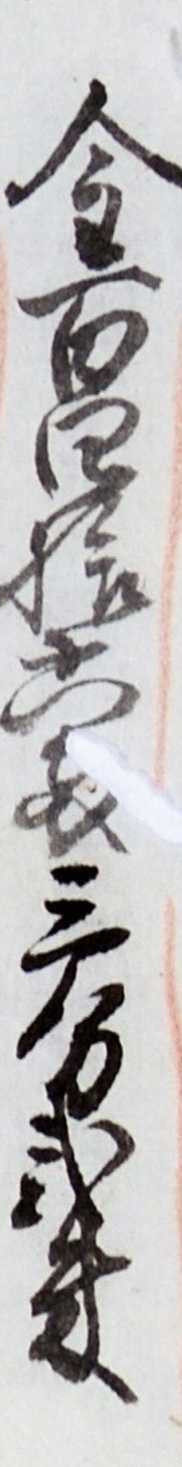金百四拾六長三分弐朱
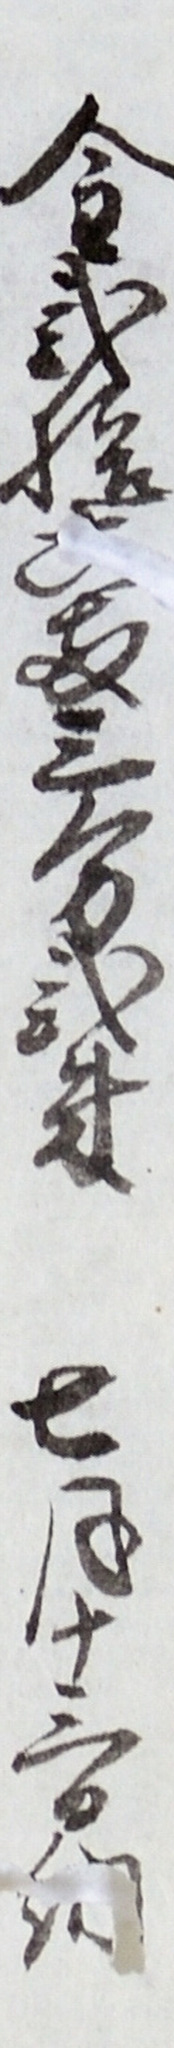金弐拾三両三分弐朱七月十三日銅
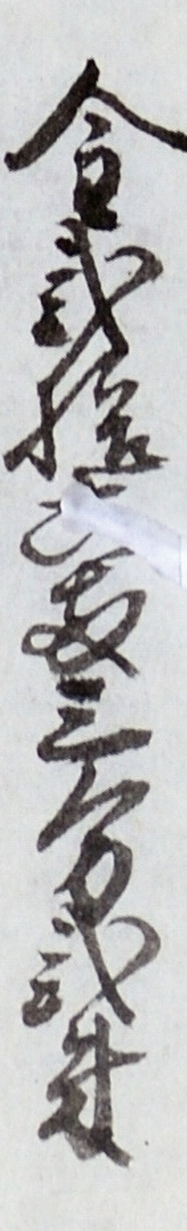金百四拾六長三分弐朱
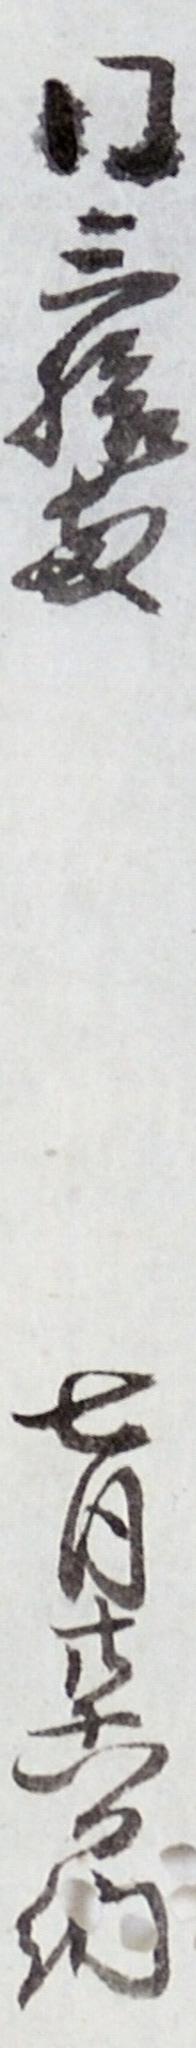同三拾両七月廿六日納
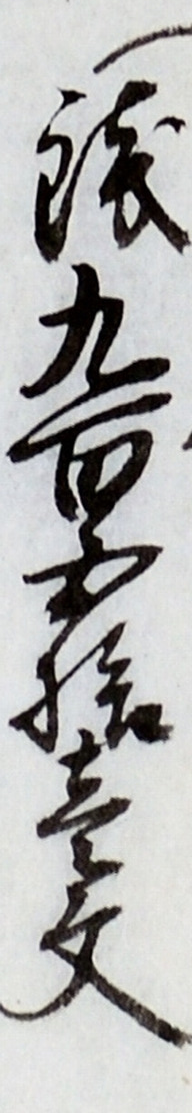銭九百五拾壱文
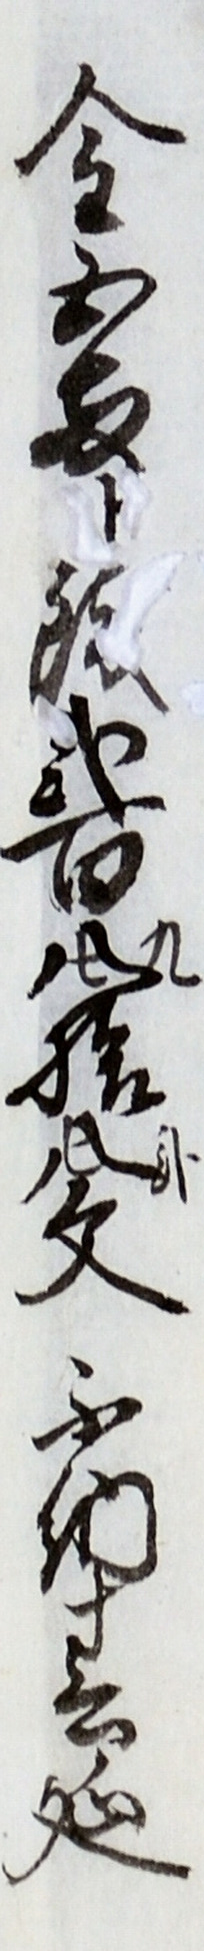金五両ト銀弐百八拾八文不納春延
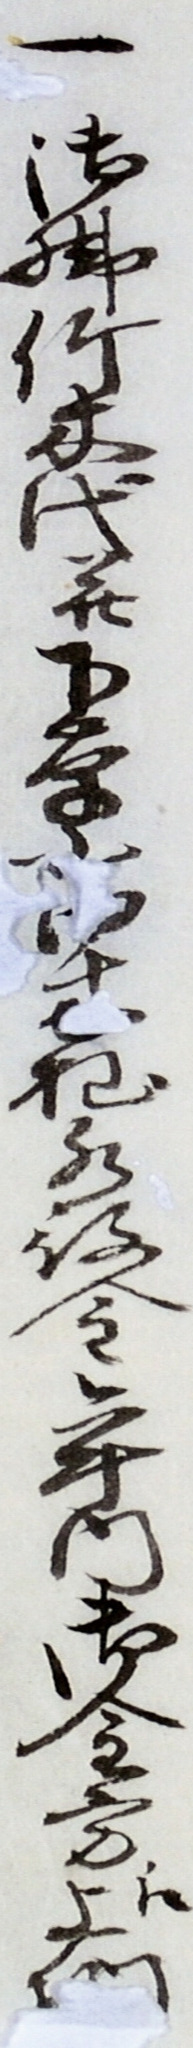一御払竹木代并下草四十把水役金年内御金方江上納
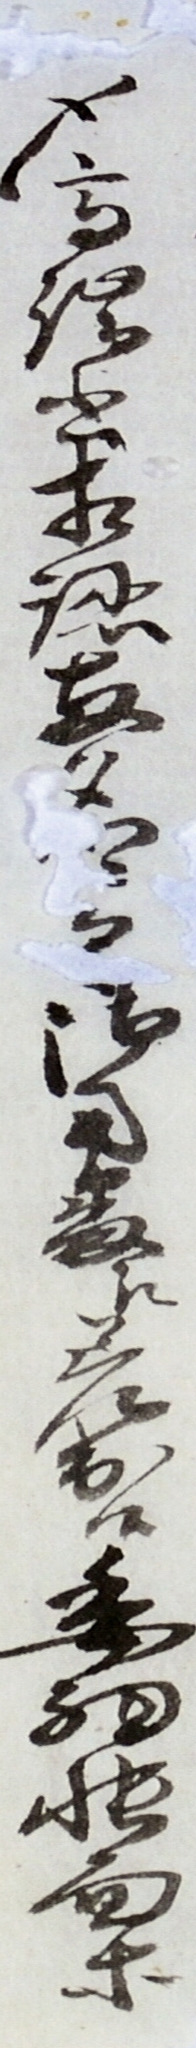〆高端書相認両〆郷ニ而御用番江委細帳面等
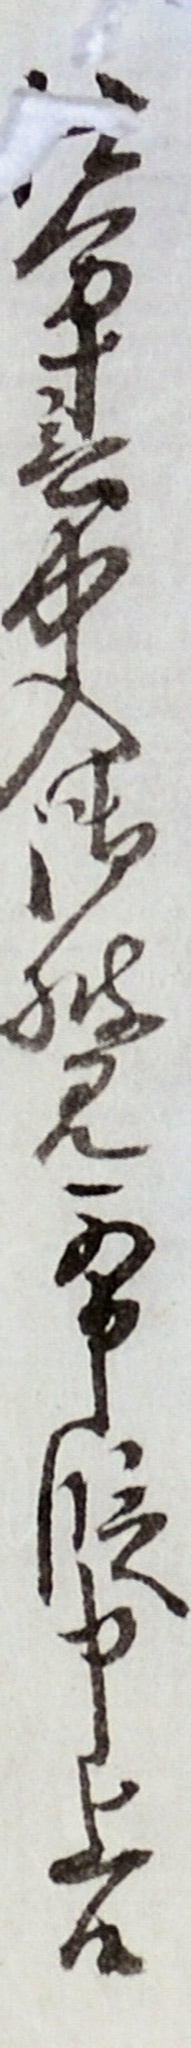御方春中入御廻見可申段申上候
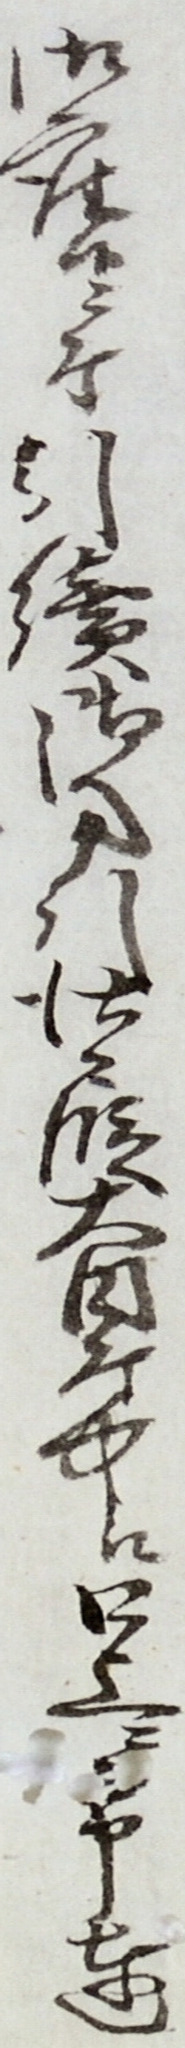御座候ニ付引続御用引仕候段大目付中江口上ニ而申達
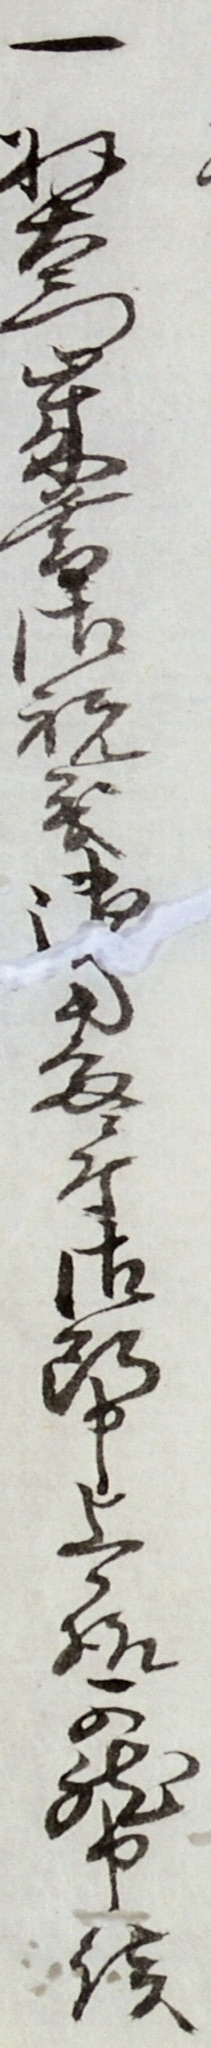一羽右衛門歳暮御祝義御用ニ付御改申上候様可然申談
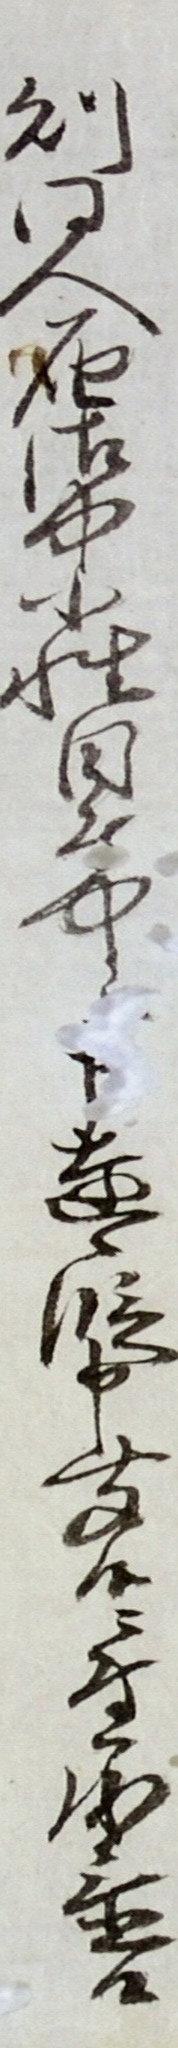則同人届御中小姓目付中達候段申聞候ニ付承置候
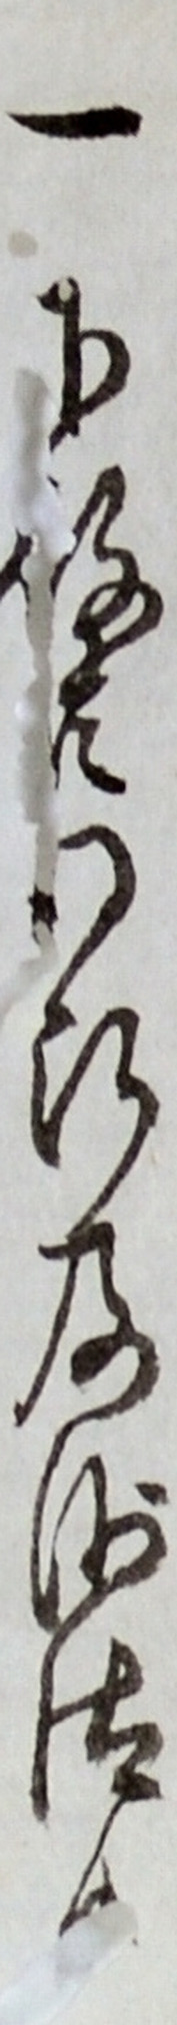一下役共同断及沙汰候
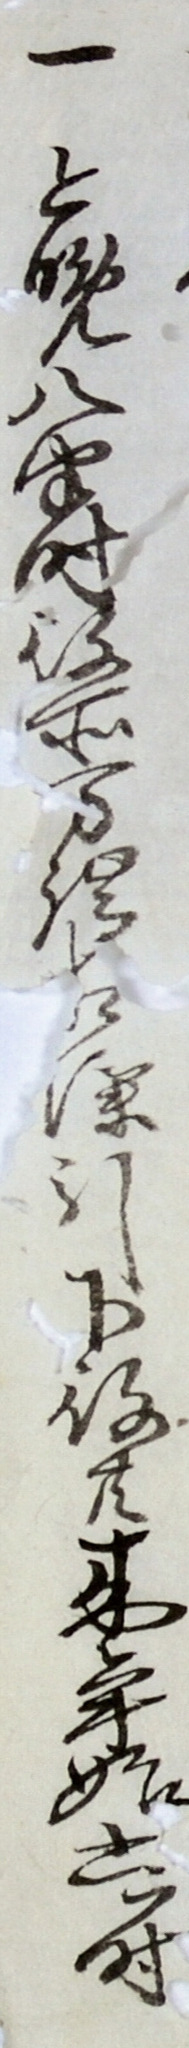一今晩八半時役所方相添引下役共来年始六ツ時

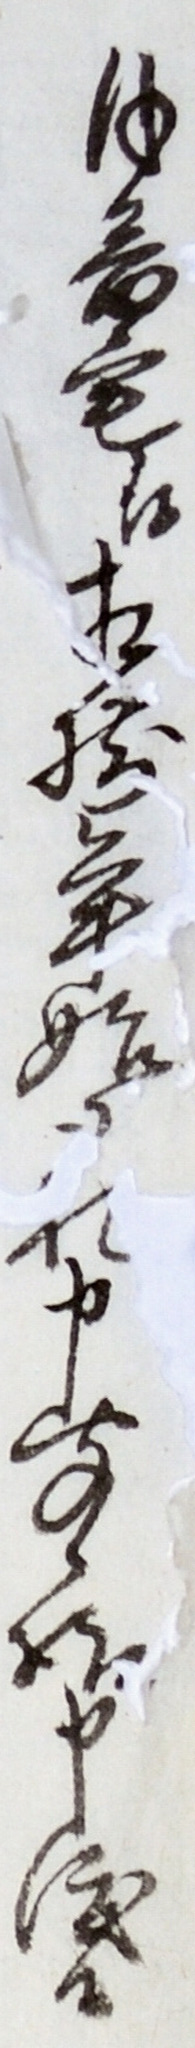月番宅江相揃年始御礼申聞候様申渡候
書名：御山奉行御用控
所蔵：伊那市立高遠町図書館・合同会社AMANE
